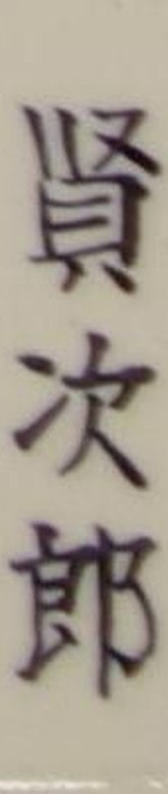賢次郎
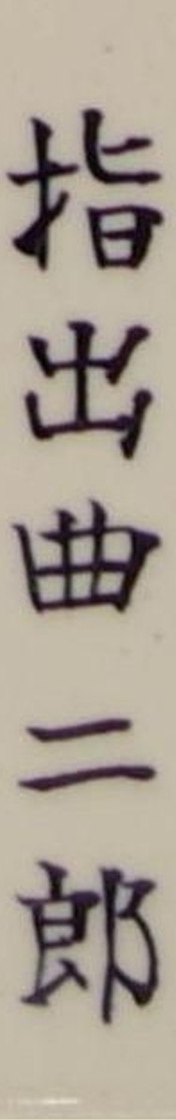指出曲二郎
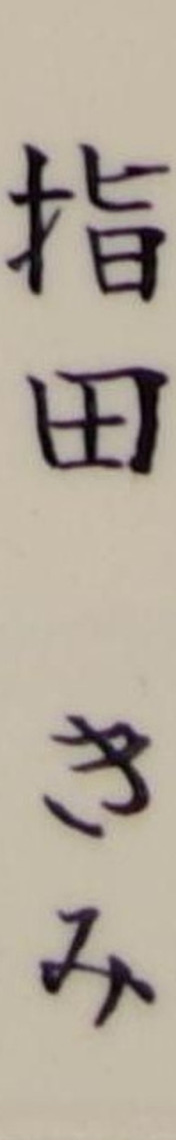指田きみ
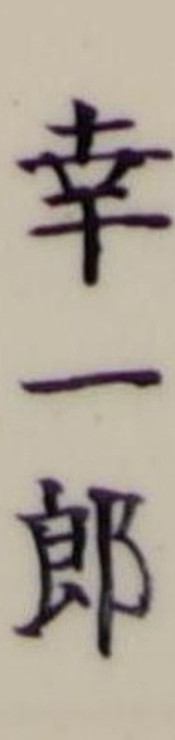幸一郎
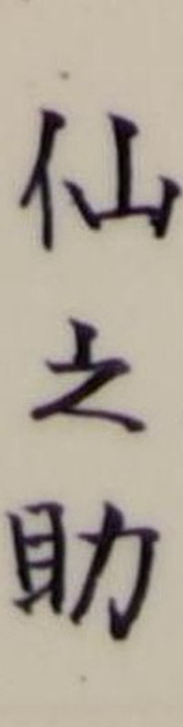仙之助
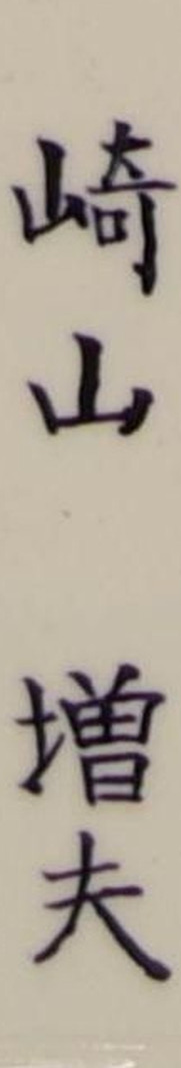崎山増夫
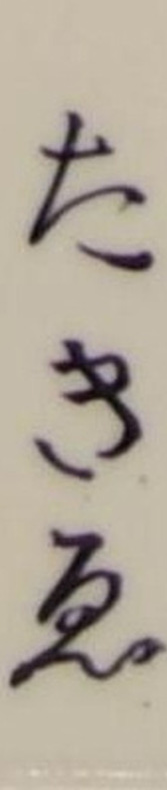たきえ
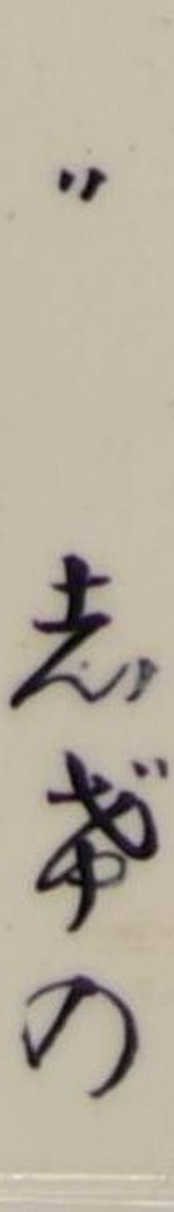しげの
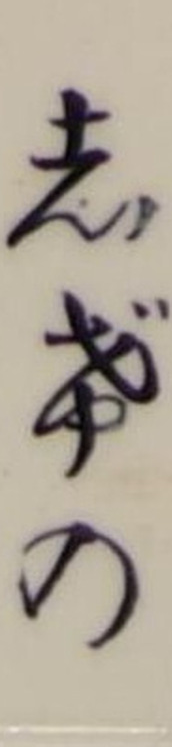しげの
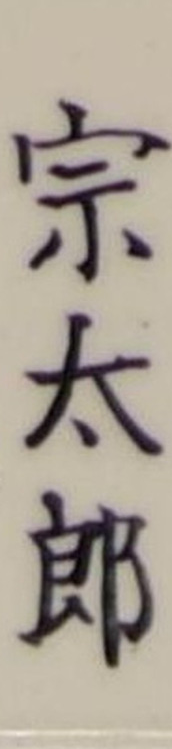宗太郎
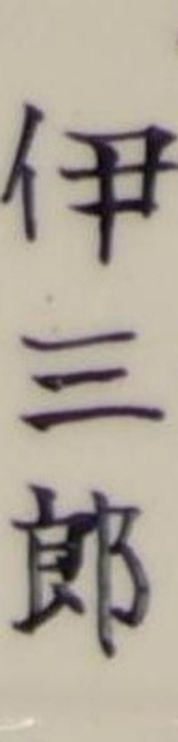伊三郎
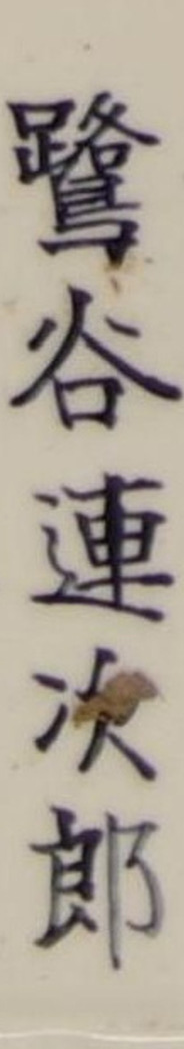鷲谷連次郎
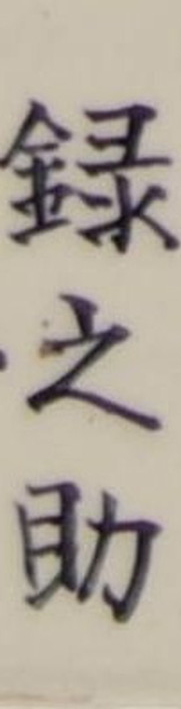録之助
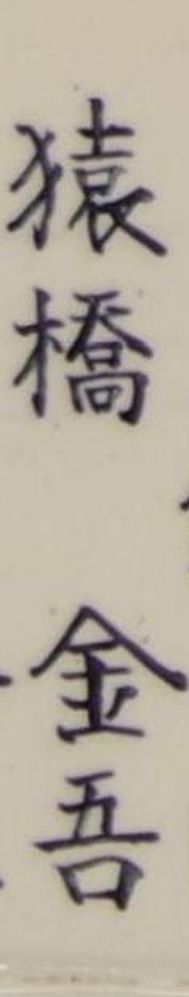猿橋金吾

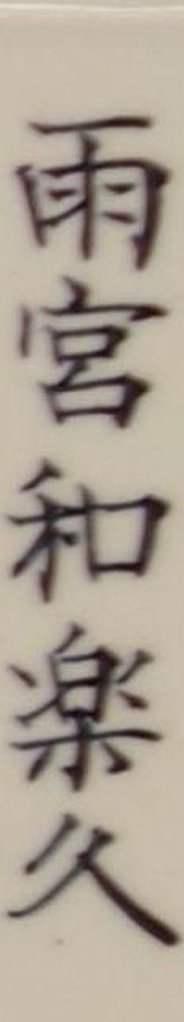雨宮和楽久
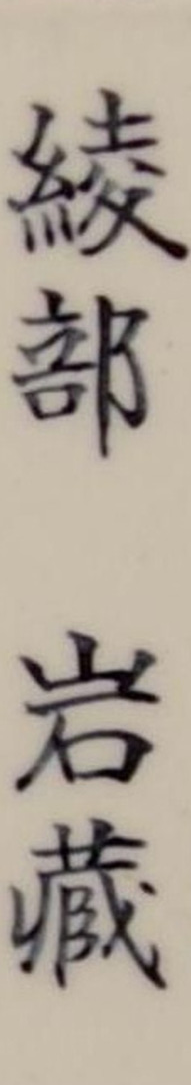綾部岩蔵
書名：E~L
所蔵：高野山金剛峯寺
